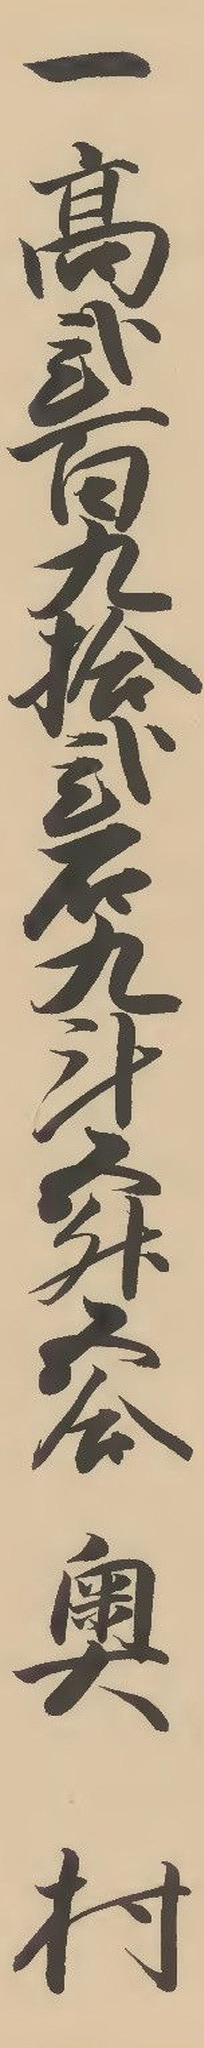一高弐百九拾弐石九斗五升五合奥村
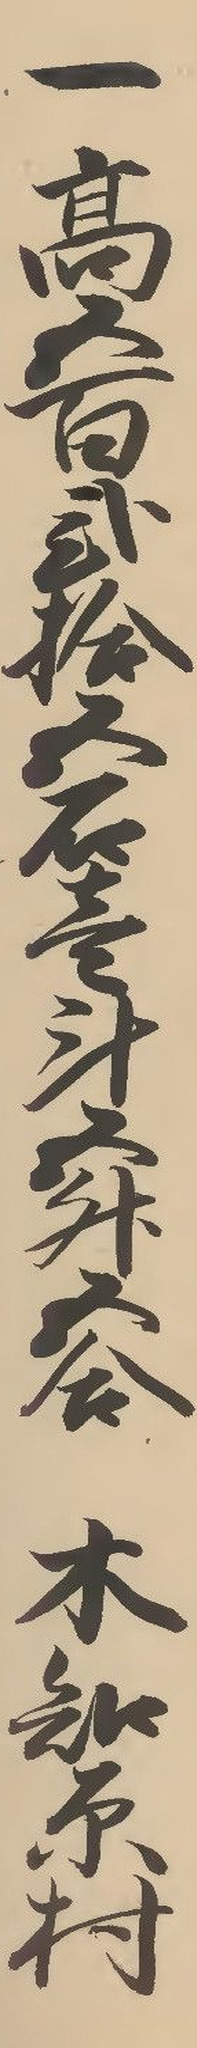一高五百弐拾五石壱斗五升五合木知原村
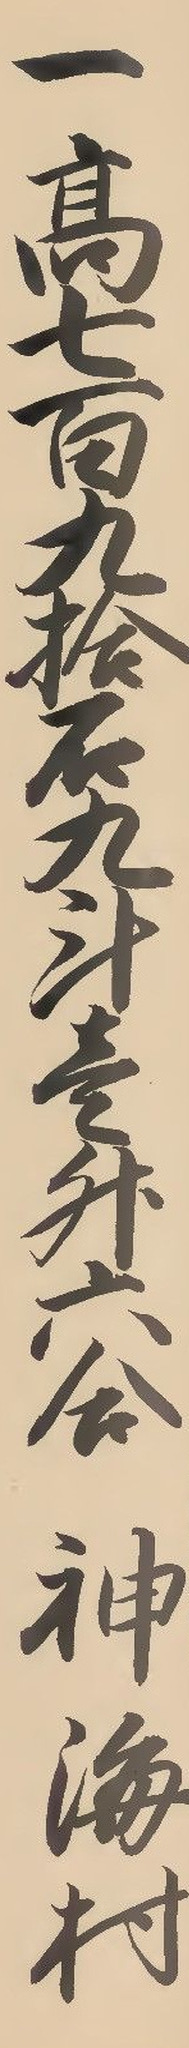一高弐百九拾弐石九斗五升五合奥村
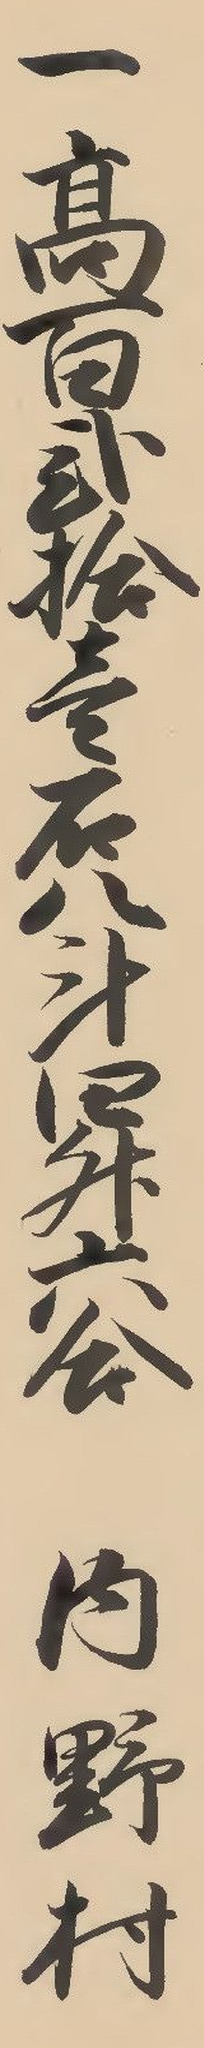一高百弐拾壱石八斗四升六合内野村
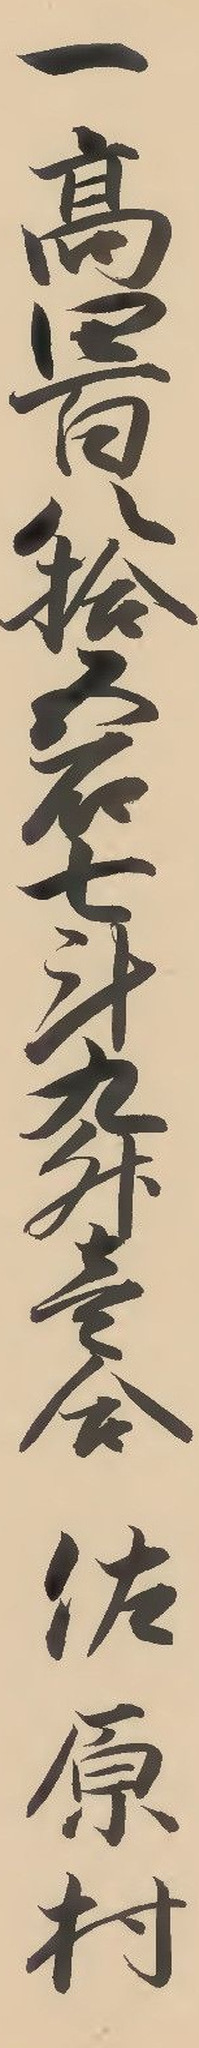一高四百八拾五石七斗九升壱合佐原村
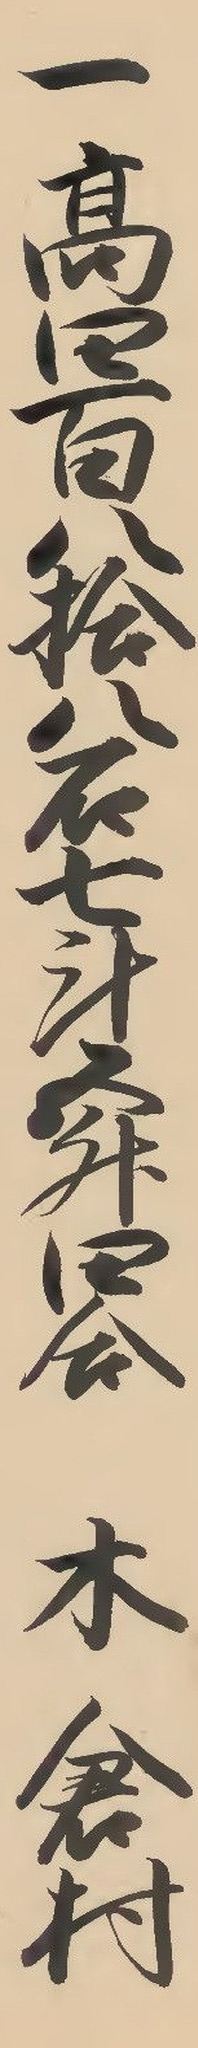一高四百八拾八石七斗五升四合木倉村

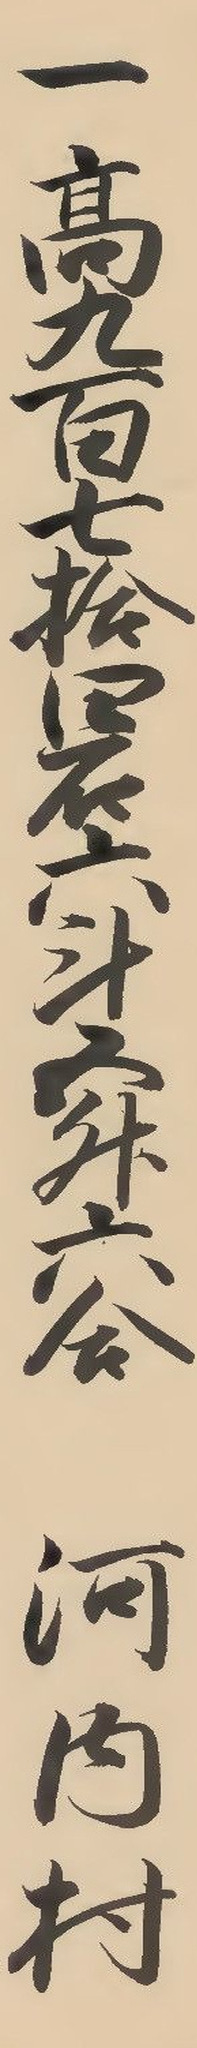一高九百七拾四石六斗五升六合河内村
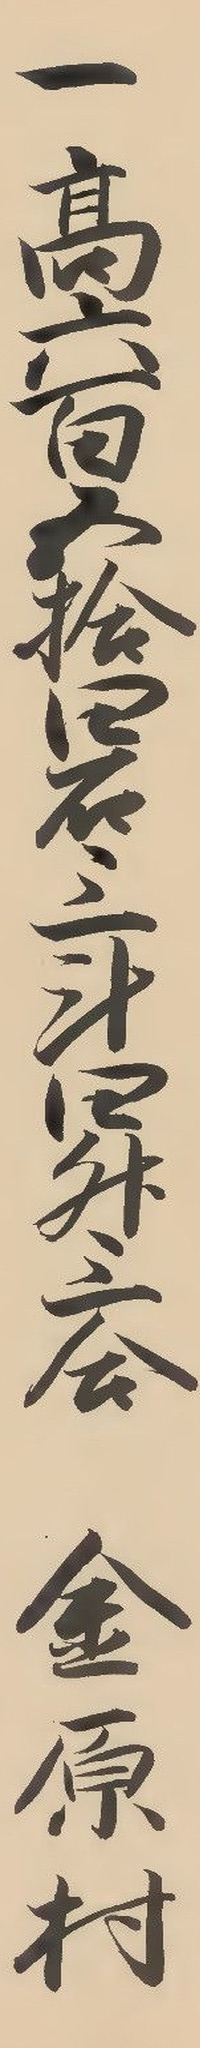一高六百五拾四石三斗四升三合金原村
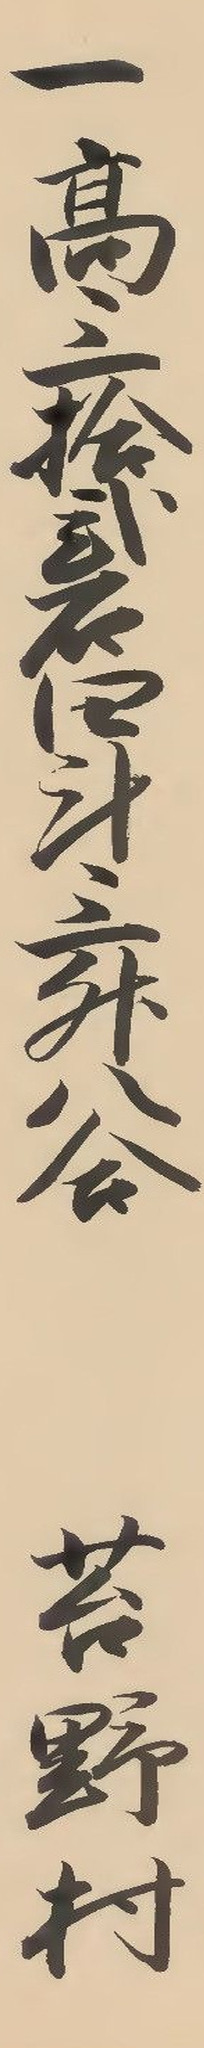一高三拾弐石四斗三升八合苔野村
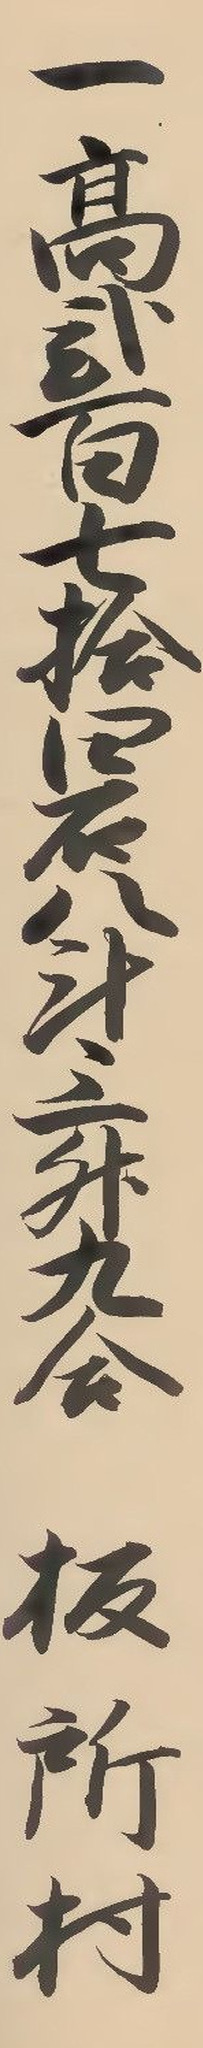一高弐百七拾四石八斗三升九合板所村
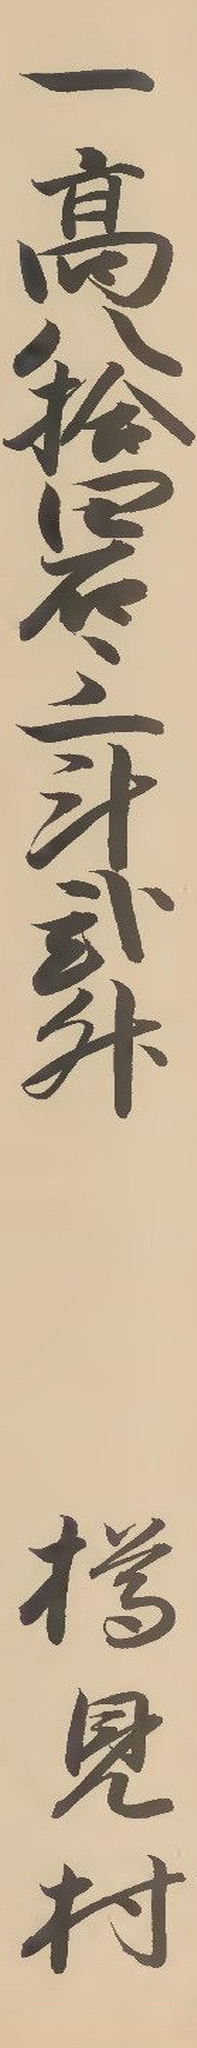一高八拾四石三斗弐升樽見村
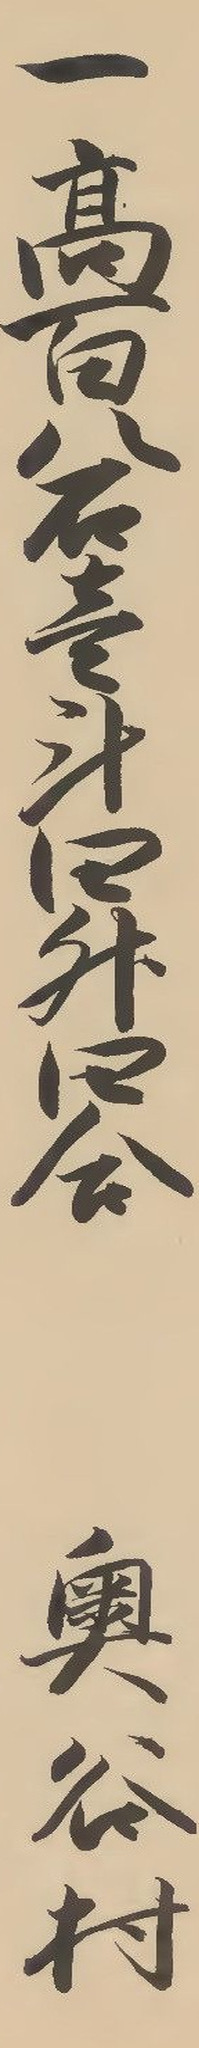一高百八石壱斗四升四合奥谷村
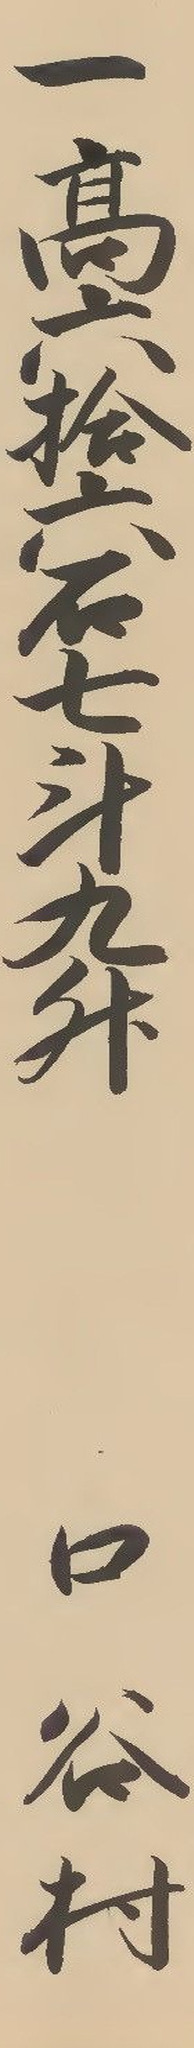一高六拾六石七斗九升口谷村
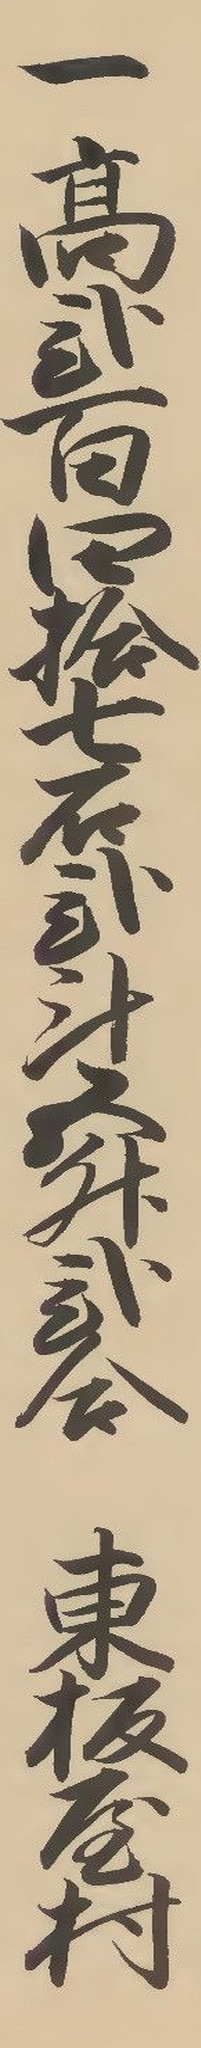一高弐百四拾七石弐斗五升弐合東板屋村

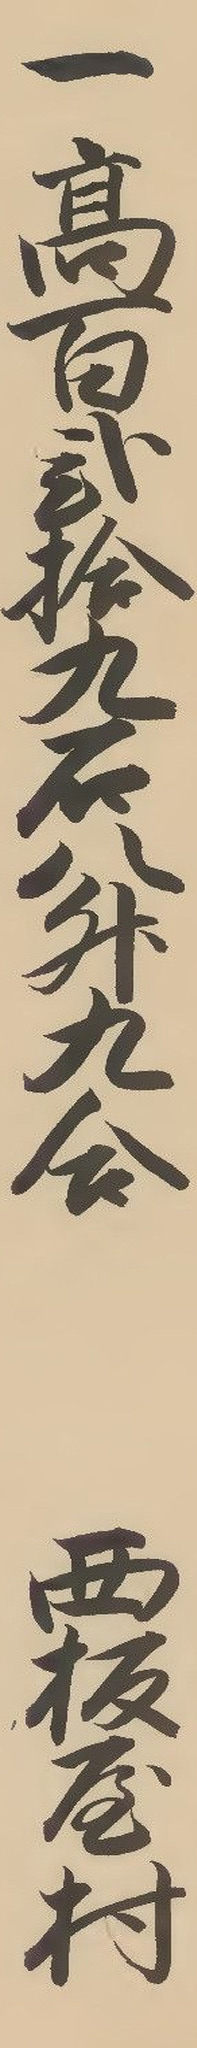一高百弐拾九石八升九合西板屋村
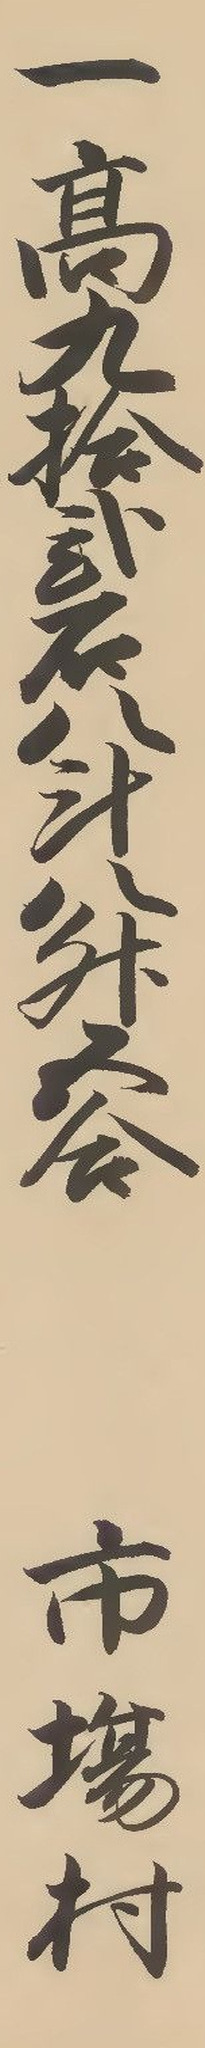一高九拾弐石八斗八升五合市場村
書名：美濃国郷帳
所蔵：国立公文書館 National Archives of Japan
